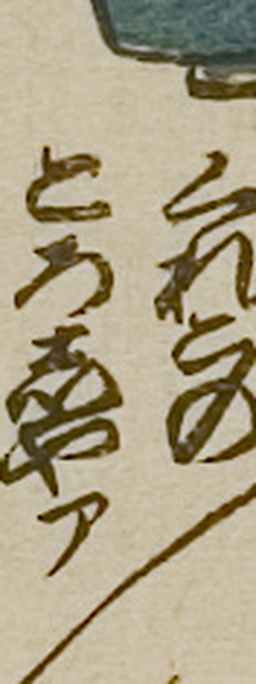ころしやア
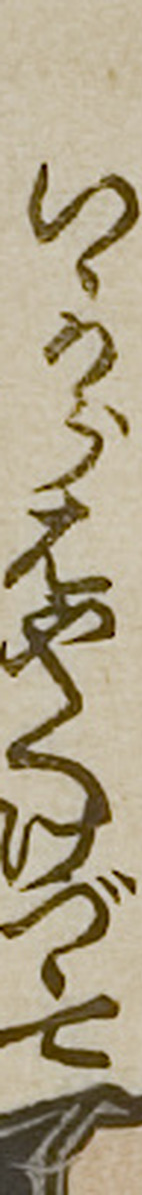いゝからはやくけづゝて
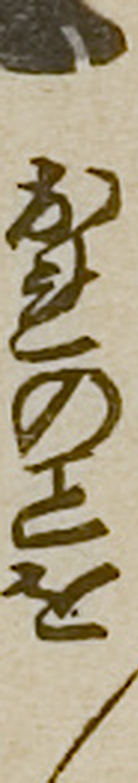おれのことを
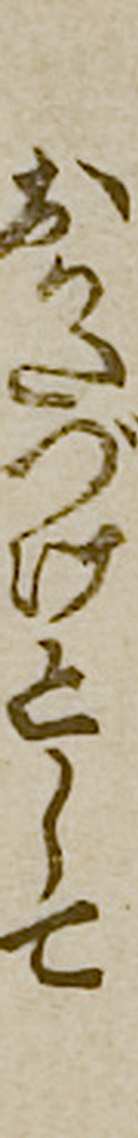おかたづけとして
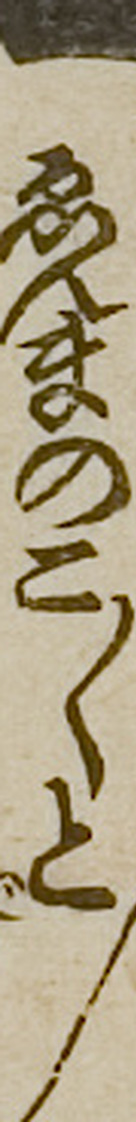ゑんまのこ＼と
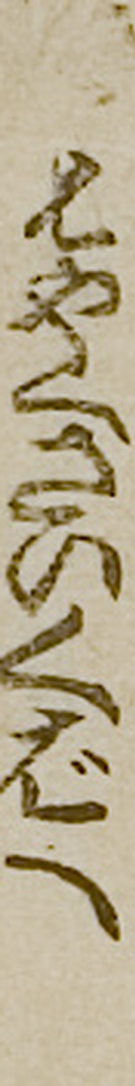はやくさいくばへ
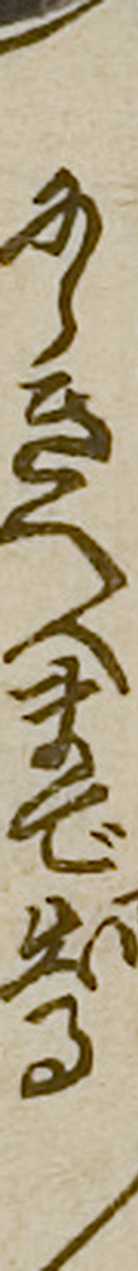にしきへへまで出る
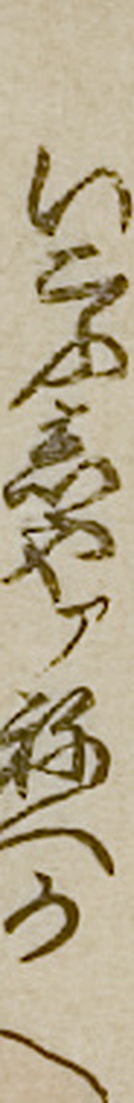いこふしやアねへか
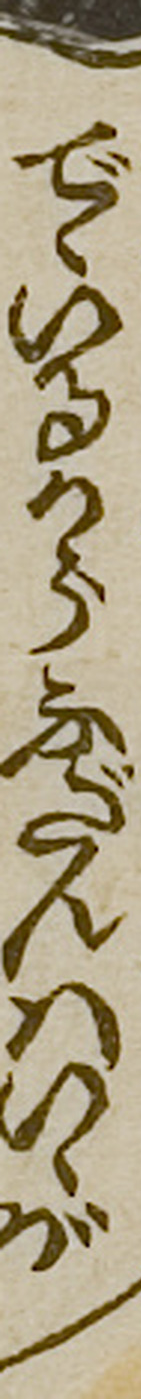でゝいるからふだんはいゝが
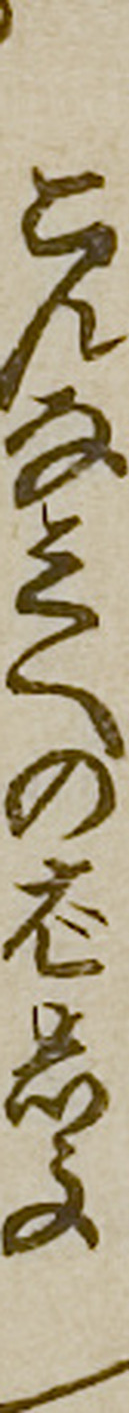こんなみへのばしよ
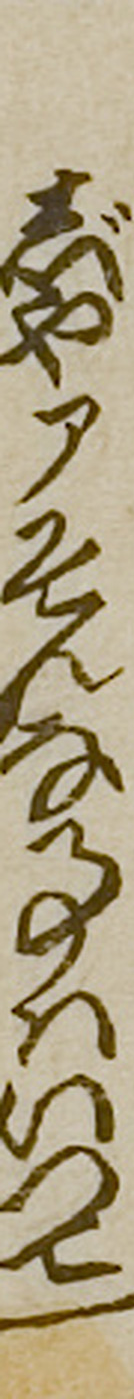じやアそんな事はいつて
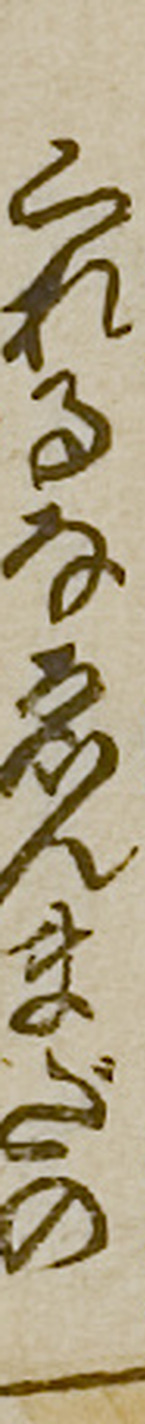くれるなゑんまだの
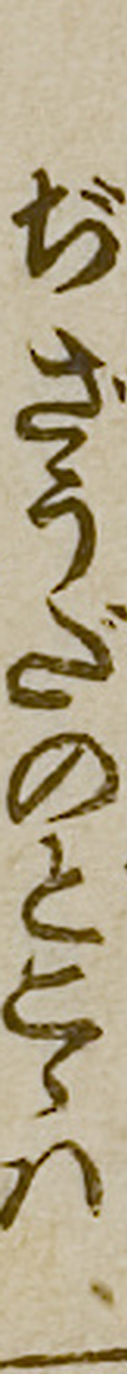ぢざうだのとこゝは
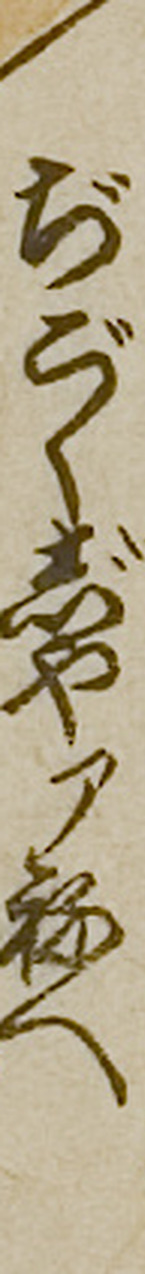ぢごくじやアねへ
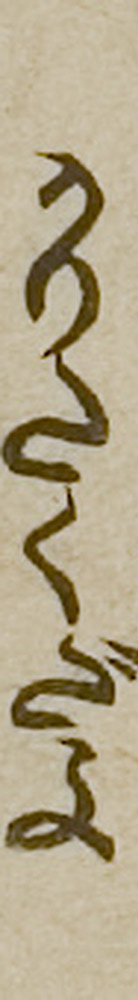かりたくだよ
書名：瓢箪
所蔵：東京大学総合図書館 General Library in the University of Tokyo, JAPAN
